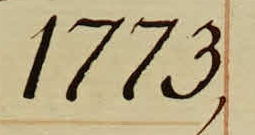1773,
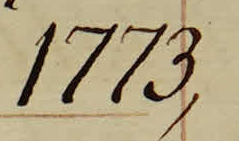1773,
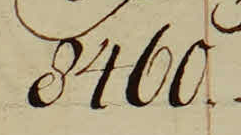8460
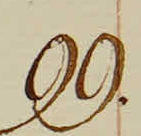99.
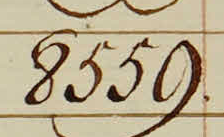8559.
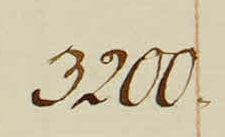3200
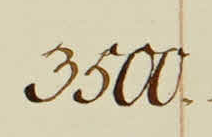3500
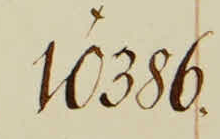10386
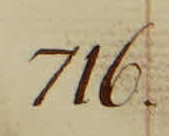716
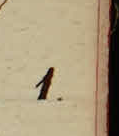1.
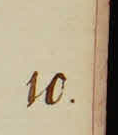10.
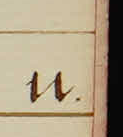11.
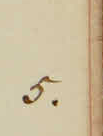5.
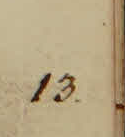13.
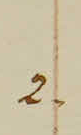2
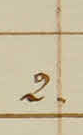2
